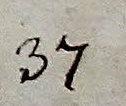37
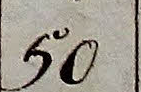50
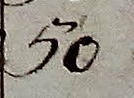50
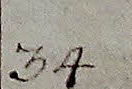34
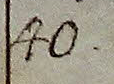40
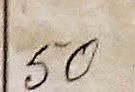50
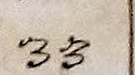33
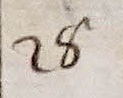28
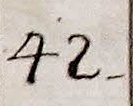42
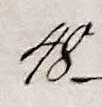48
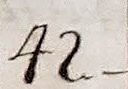42
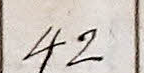42
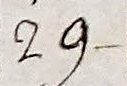29
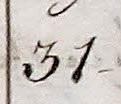31
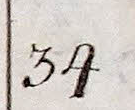34
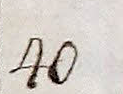40
